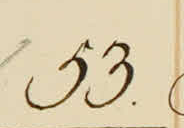53.
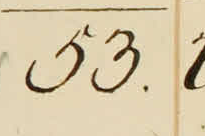53.
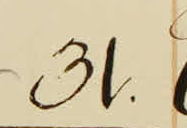31.
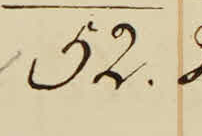52.
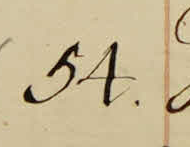54.
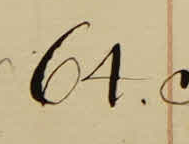64.
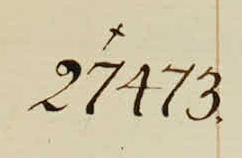27473.
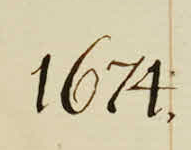1674.
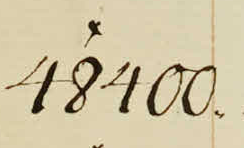48400
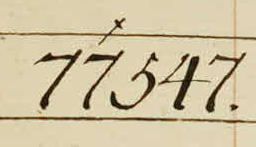77547.
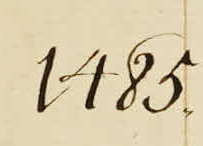1485
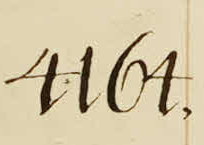4164
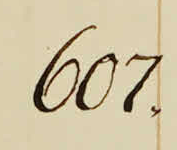607
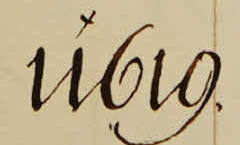11619.
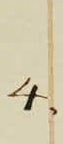4
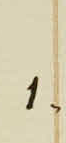1
